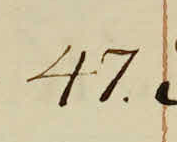47.
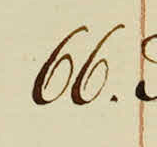66.
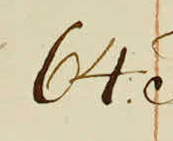64.
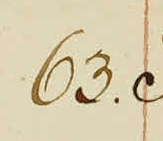63.
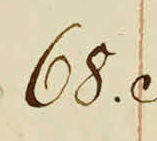68.
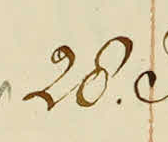28.
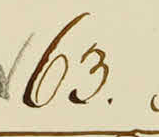63.
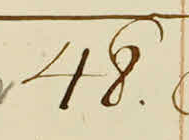48.
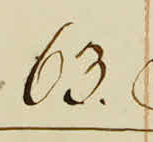63.
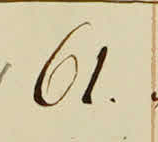61.
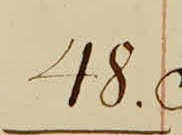48.
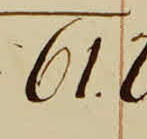61.
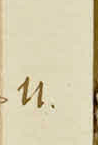11.
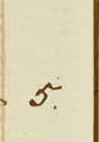5.
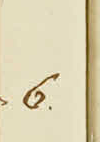6.
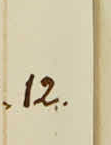12.
